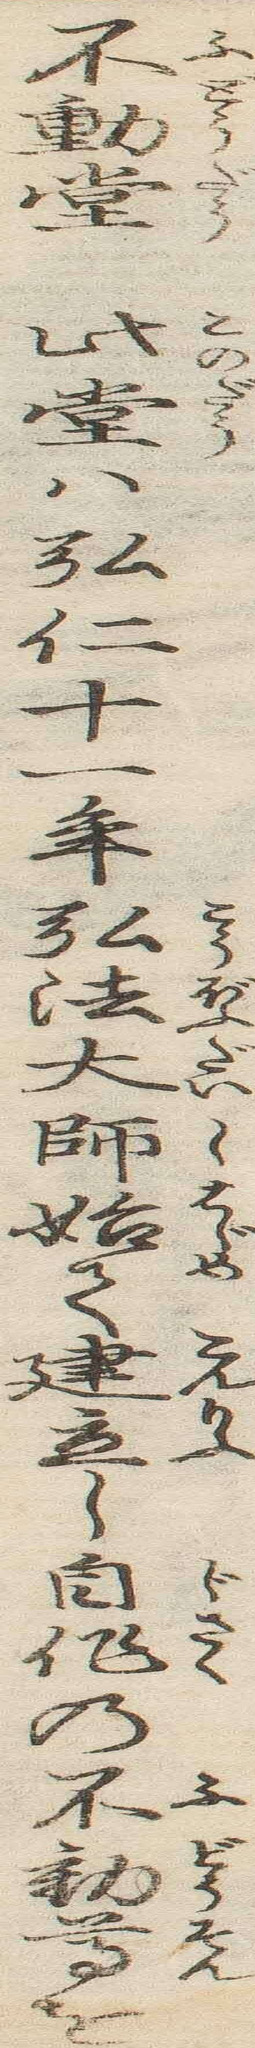不動堂此堂は弘仁十一年弘法大師始て建立し自作の不動尊を
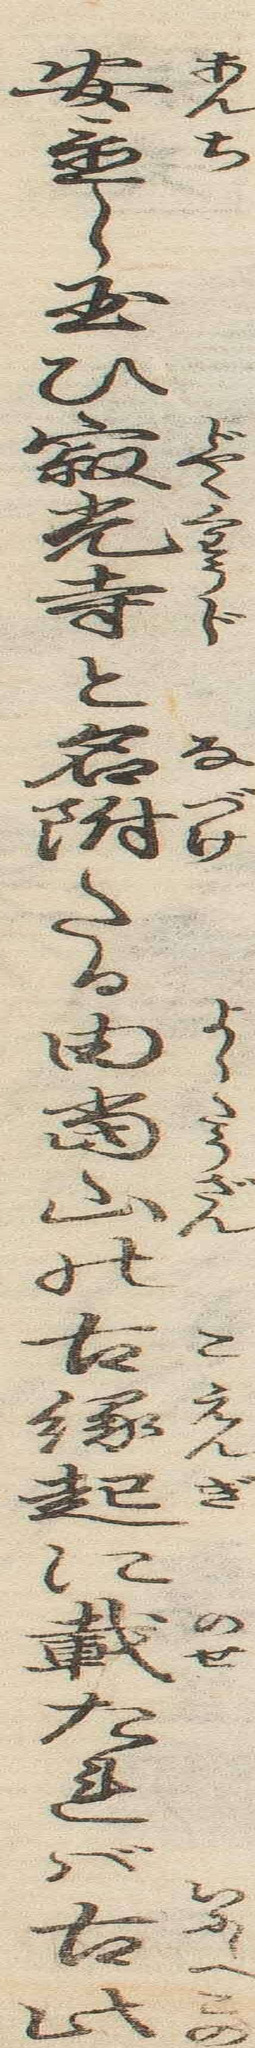安置し玉ひ寂光寺と名附たる由當山の古縁起に載たれば古此

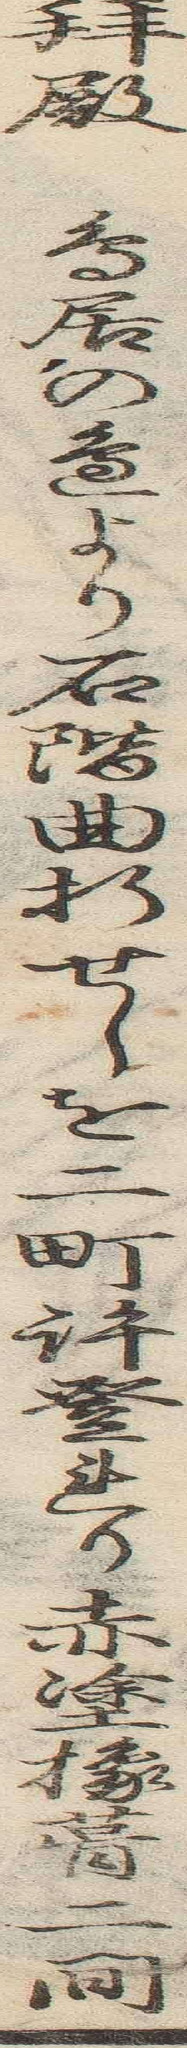拜殿鳥居の邊より石階曲折せしを二町許登れり赤塗橡葺二間
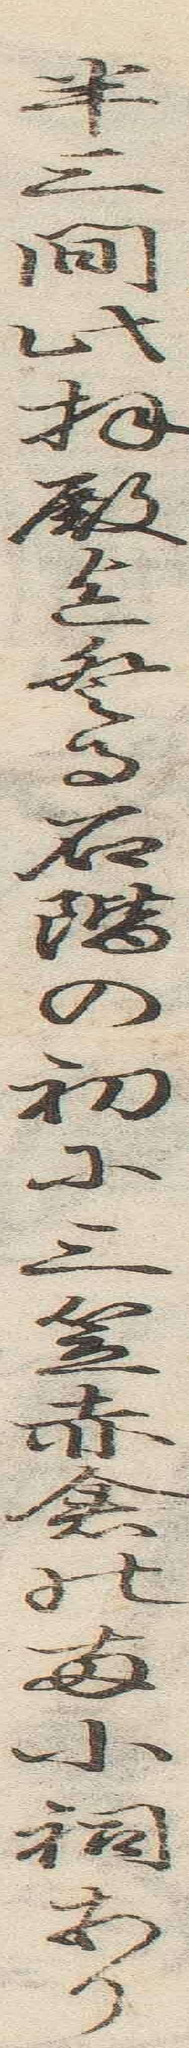半三間此拜殿迄登る石階の初に三笠赤倉の両小祠あり
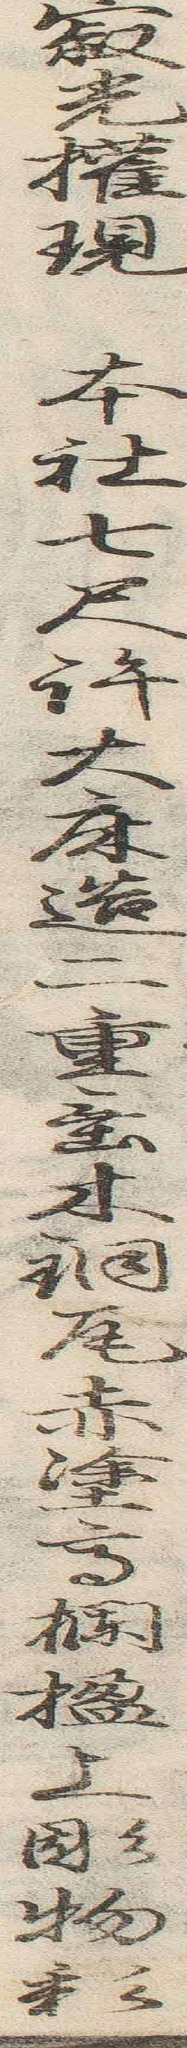寂光權現本社七尺許大床造二重垂木銅瓦赤塗高欄楹上彫物彩
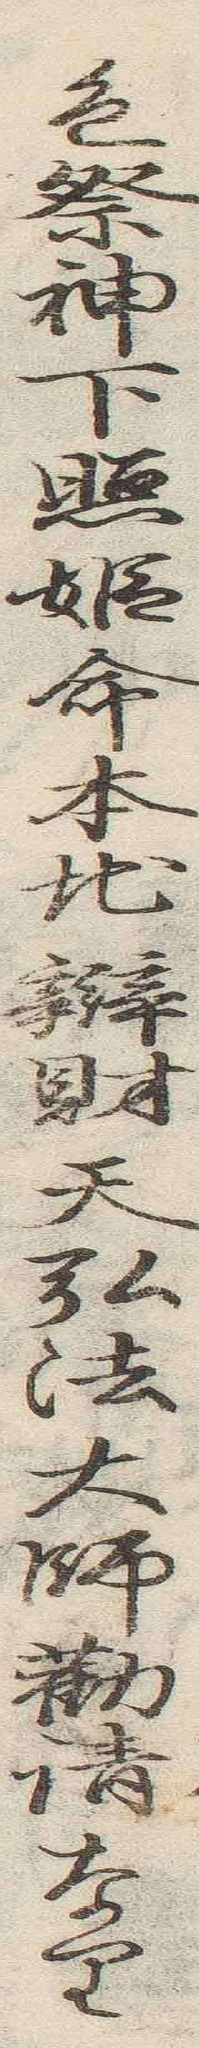色祭神下照姫命本地辨財天弘法大師勸請なり
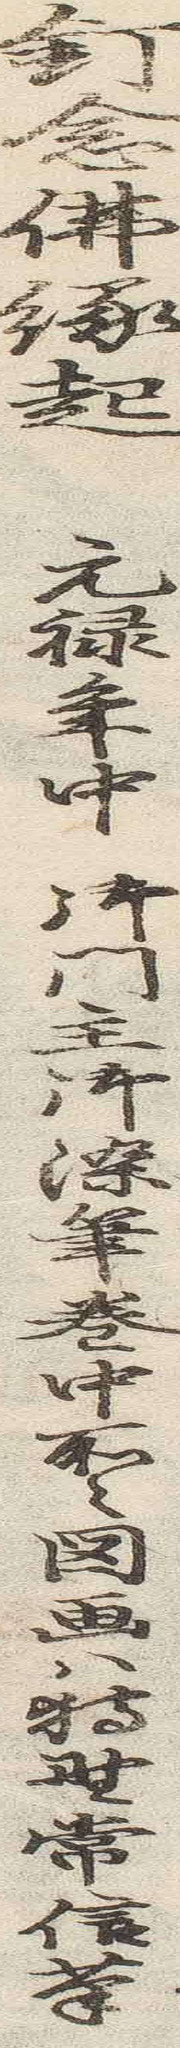釘念佛縁起元禄年中御門主御染筆巻中所〻図画は狩㙒常信筆
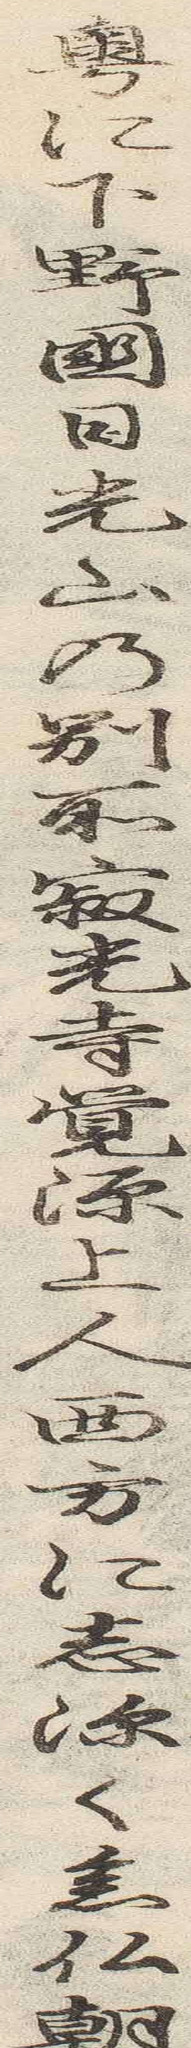粤に下野國日光山の別所寂光寺覚源上人西方に志深く念仏朝
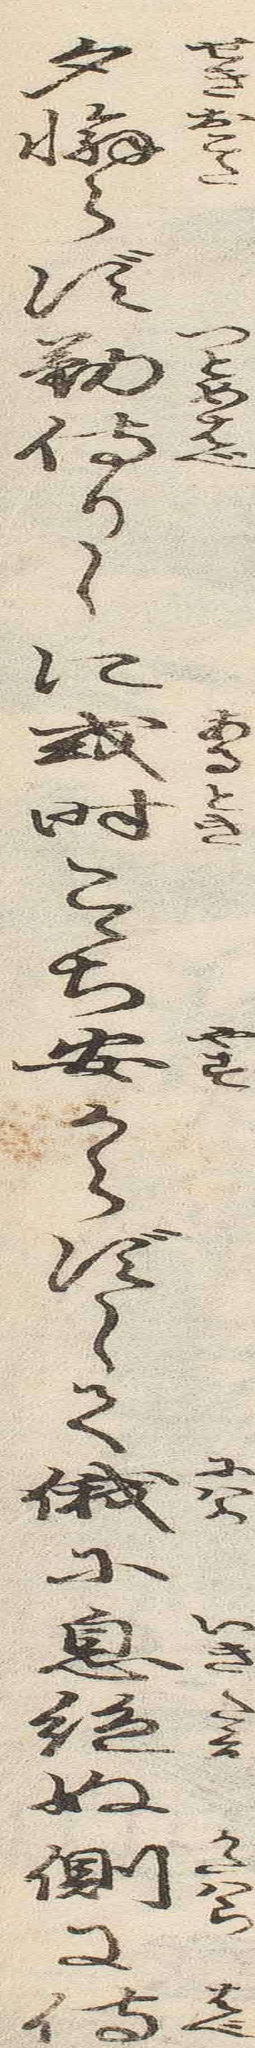夕懈らず勤侍りしに或时こゝち安からずして俄に息絶ぬ側に侍
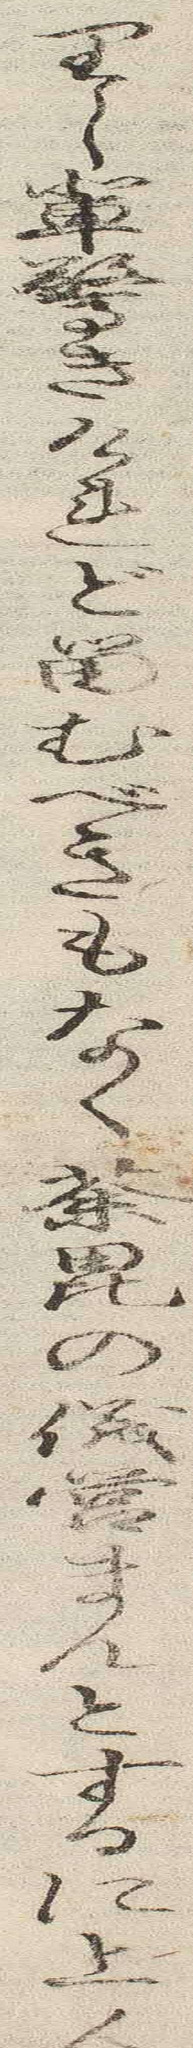りし輩驚きけれど畄むべきもなく荼毘の儀営まんとするに上人
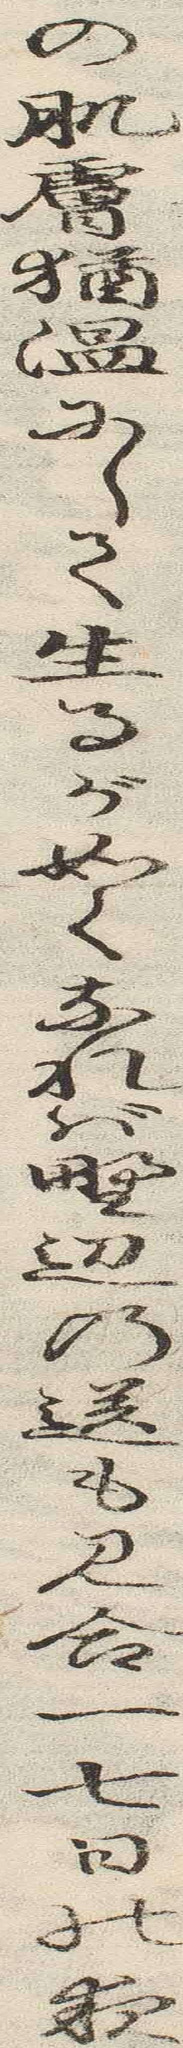の肌膚猶温にして生るが如くなれば㙒辺の送も見合一七日の夜
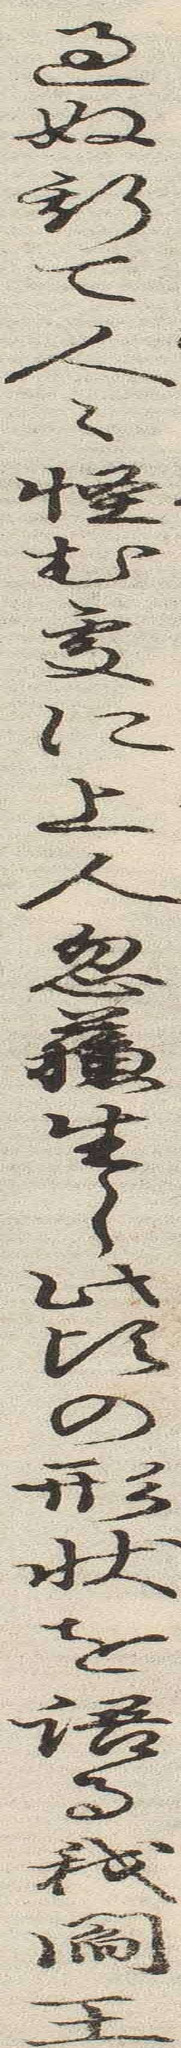過ぬ斯て人〻怪む處に上人忽蘓生し此頃の形状を語る我閻王
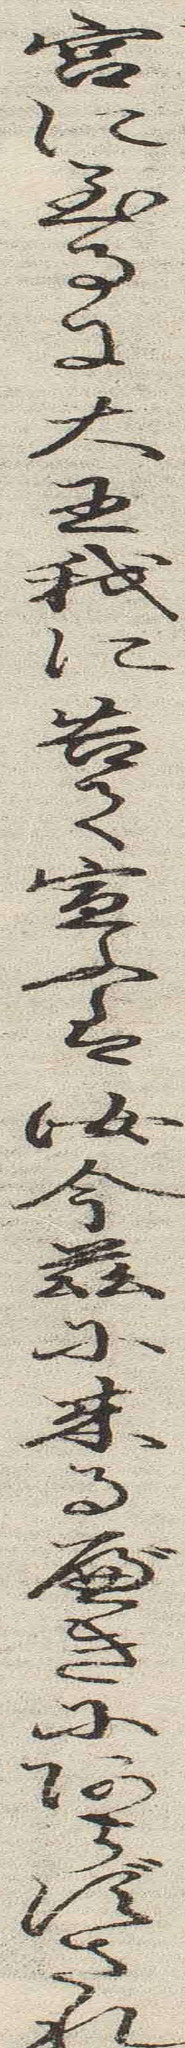宮に至るに大王我に告て宣ふは汝今兹に來るべきにあらずされ
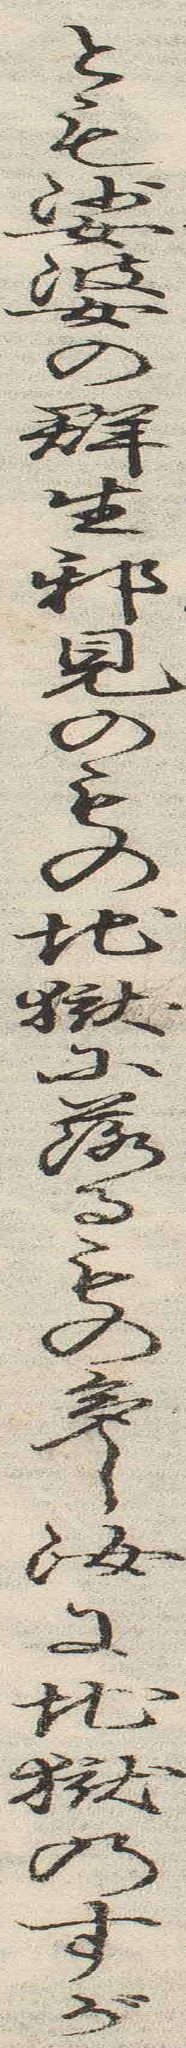とも娑婆の群生邪見のもの地獄に落るもの多し汝に地獄のすが
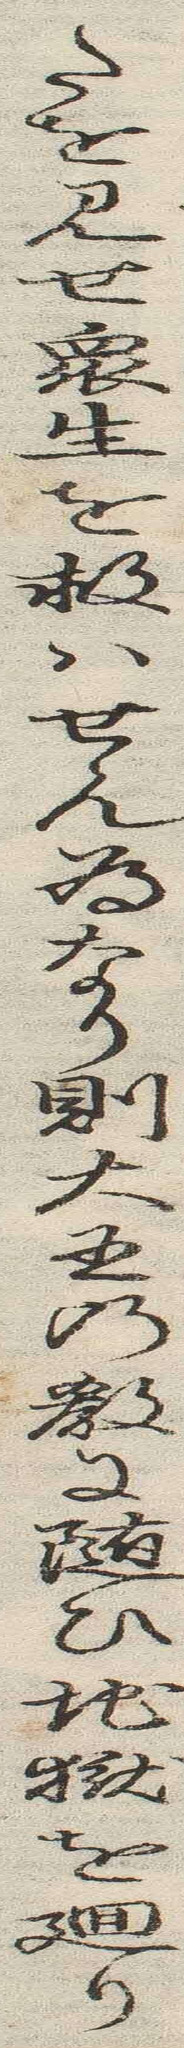たを見せ衆生を救はせん為なり則大王の敎に随ひ地獄を廽り
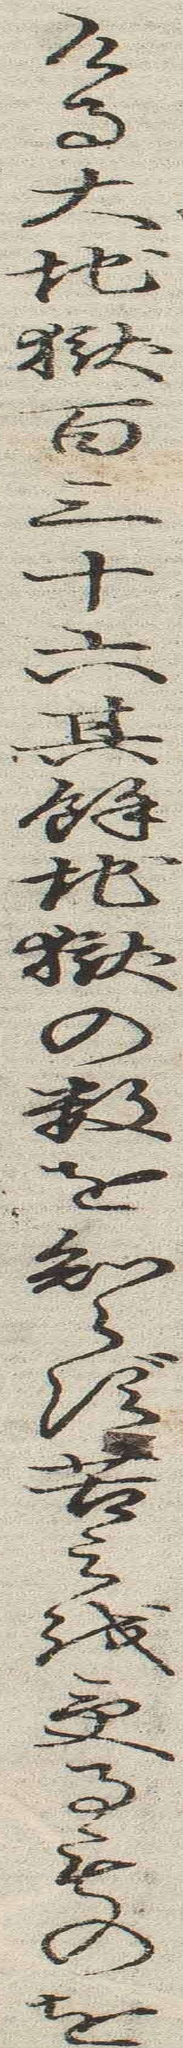ける大地獄百三十六其餘地獄の数を知らず苦みを受るものを
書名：日光山志
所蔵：東京学芸大学附属図書館 国文学研究資料館
